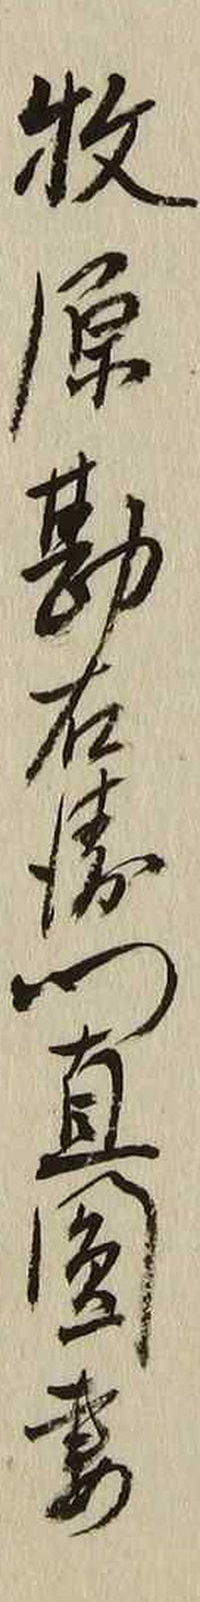女枚原勘右衛門直円妻
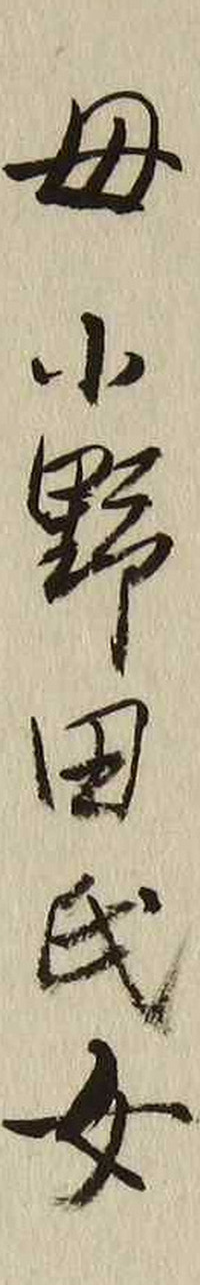母小野田氏女
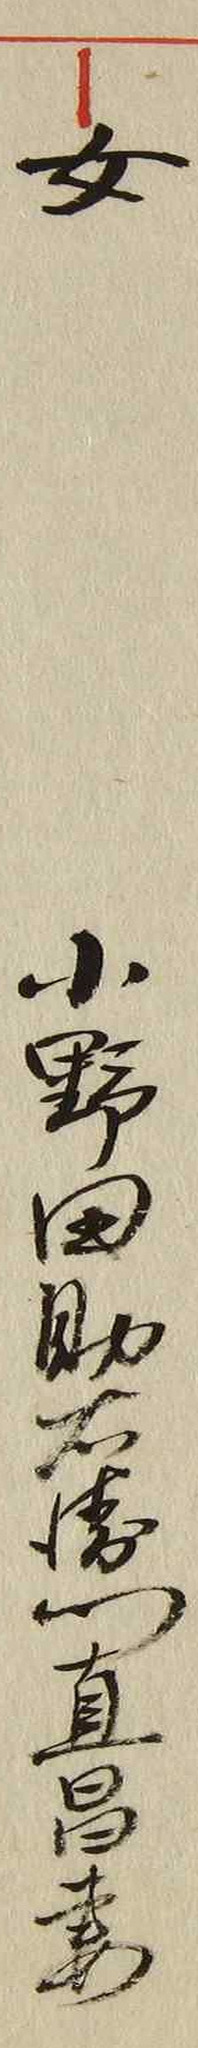女小野田助右衛門直昌妻
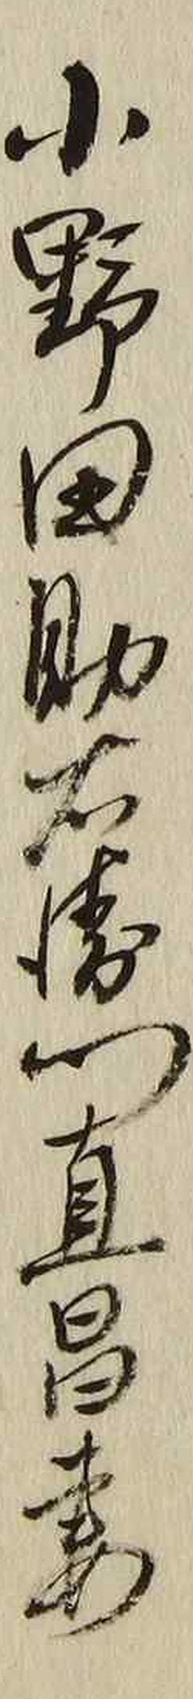女小野田助右衛門直昌妻
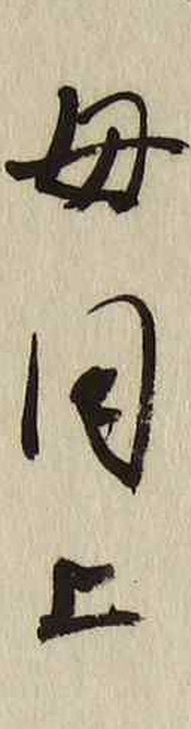母同上

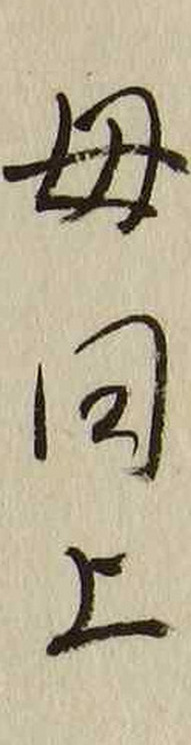母同上
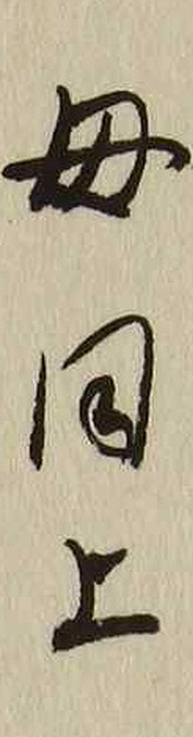母同上
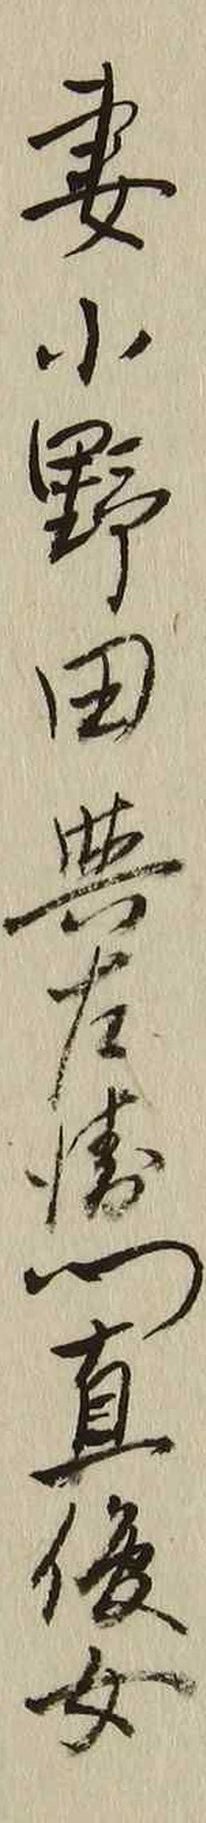妻小野田与左衛門直俊女
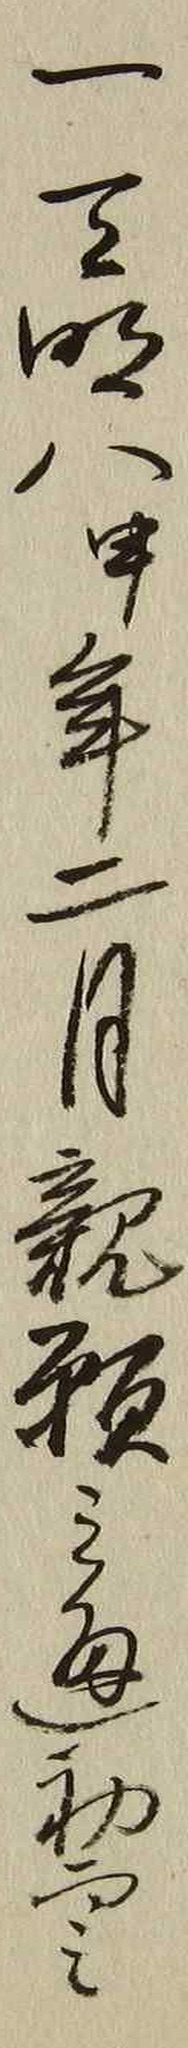一天明八申年二月親願之通初而之
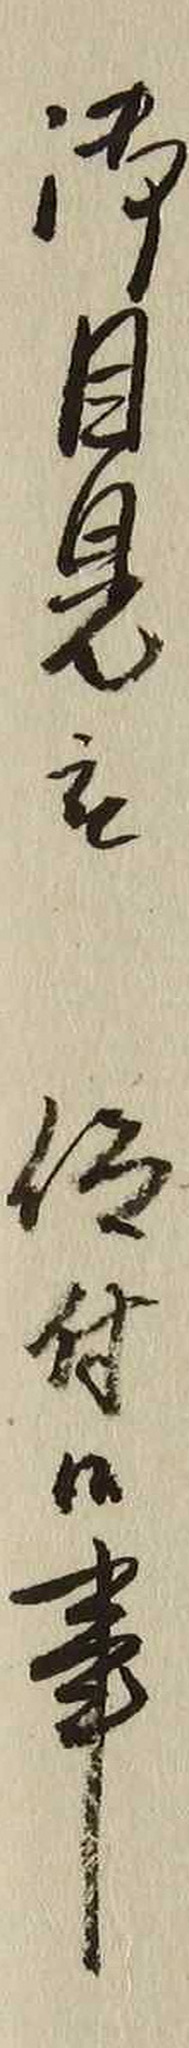御目見被仰付候事
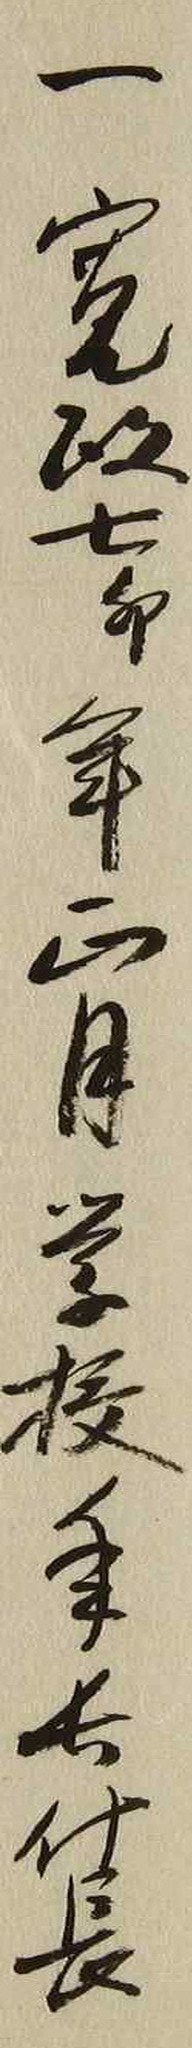一寛政七卯年正月学校年長什長
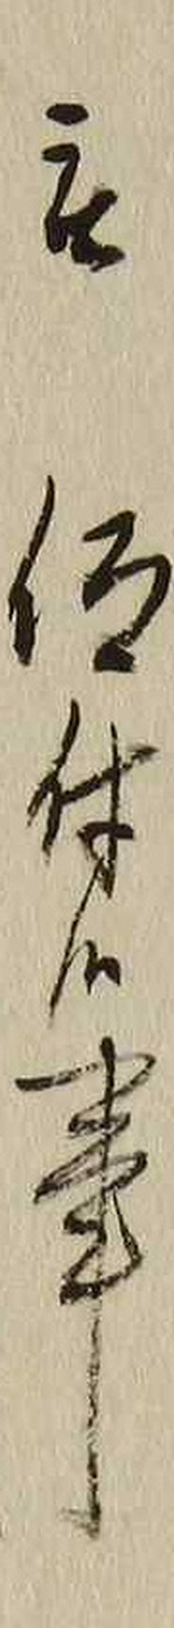被仰付候事
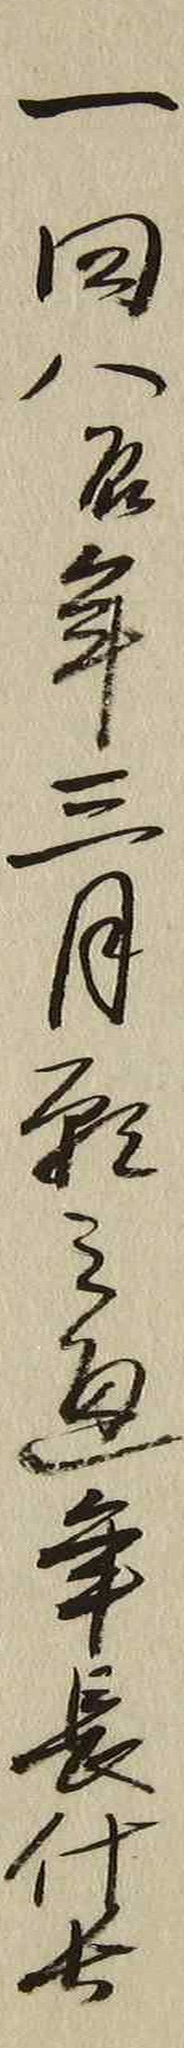一同八辰年三月願之通年長什長
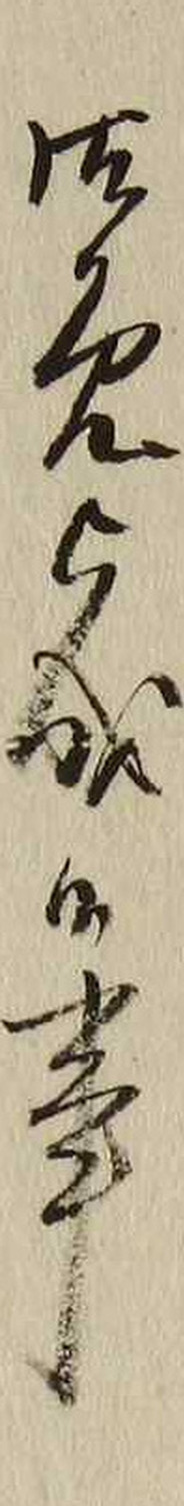御免被成候事
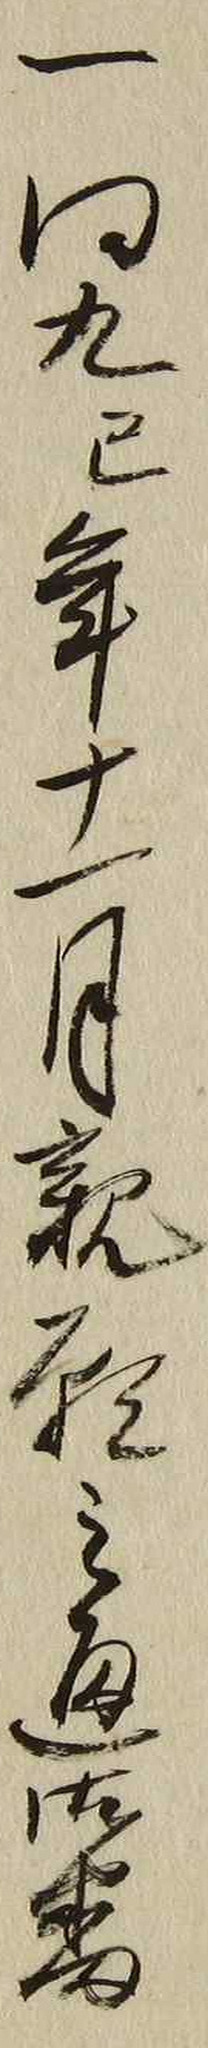一同九巳年十一月親願之通御番
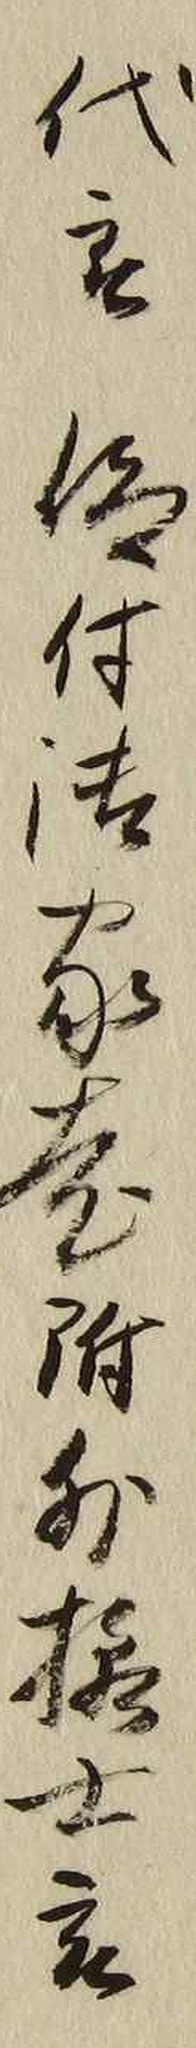代被仰付御家老附外様士被
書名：諸士系譜　巻之356　す之部6
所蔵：会津若松市立会津図書館
